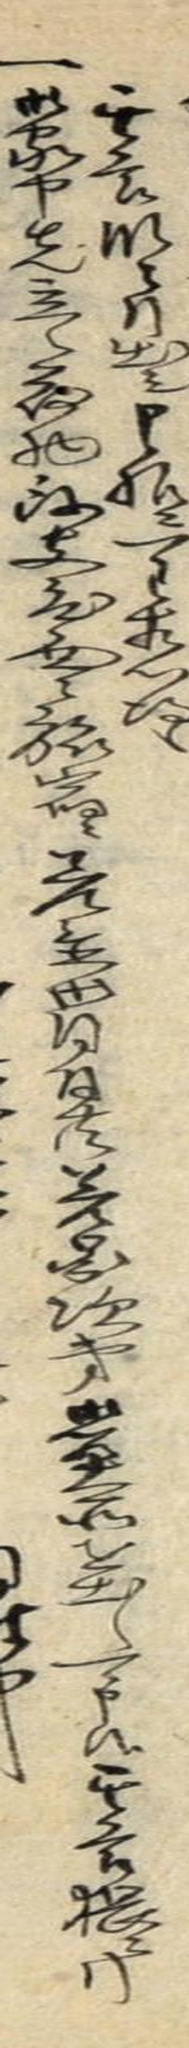一御家中先立候荷物致支度面々旅宿に差置御目付共差図次第御関所を出し可申候其節猥に引
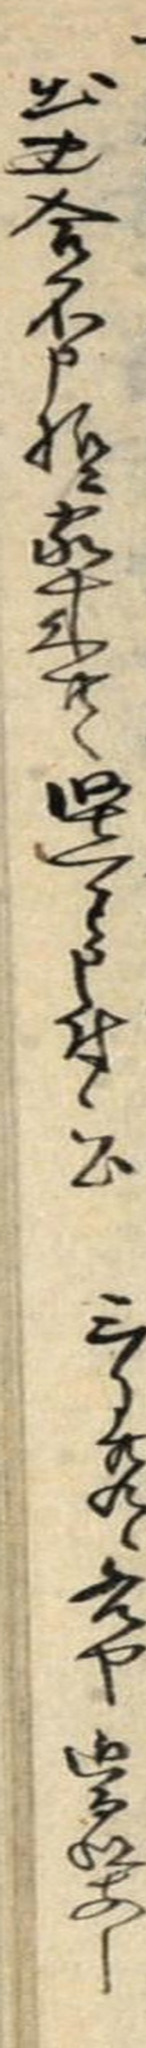出込合不申様に家来共へ堅可被申付候以上三月廿九日各中追而組目付中

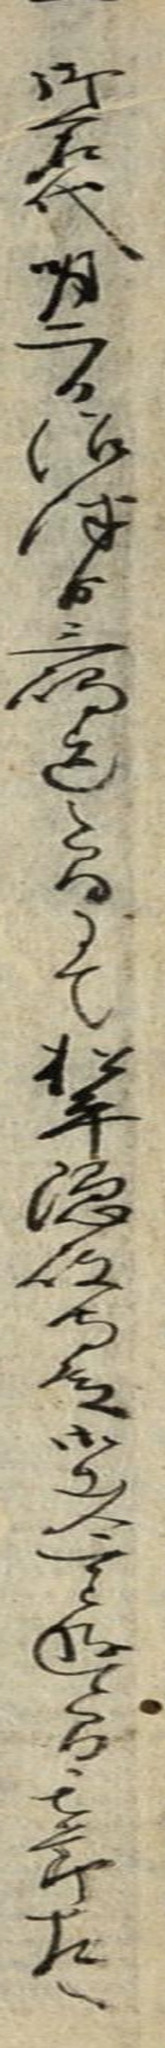一御名代明二日沼津ゟ三嶋迄之間にて松平隠岐守殿御出合可被遊候間其節左へ
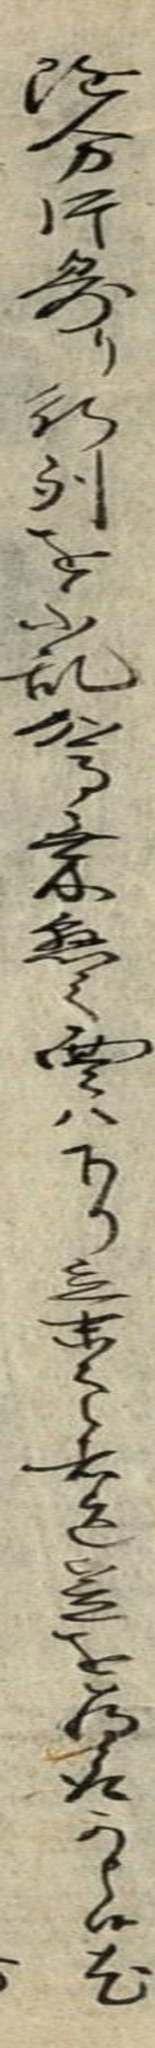随分片寄り御行列を不乱駕乗懸之面々は下り立末々之者迄笠を為取可申候尤
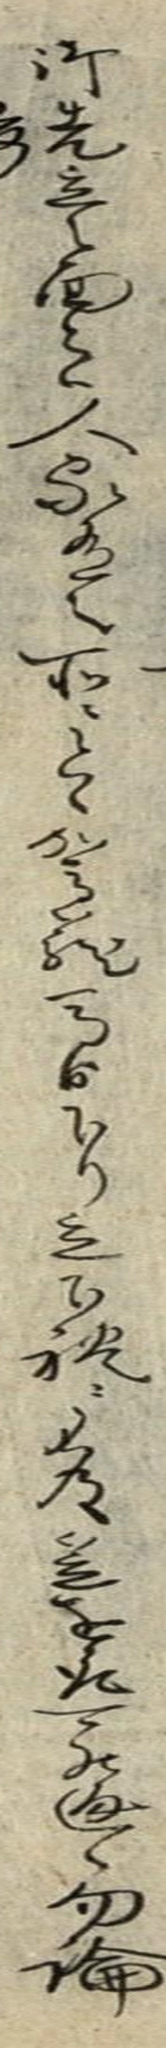御先立之面々は人家有之所に候はゝ駕篭馬ゟ下り立下礼に不及笠を取可罷通候勿論
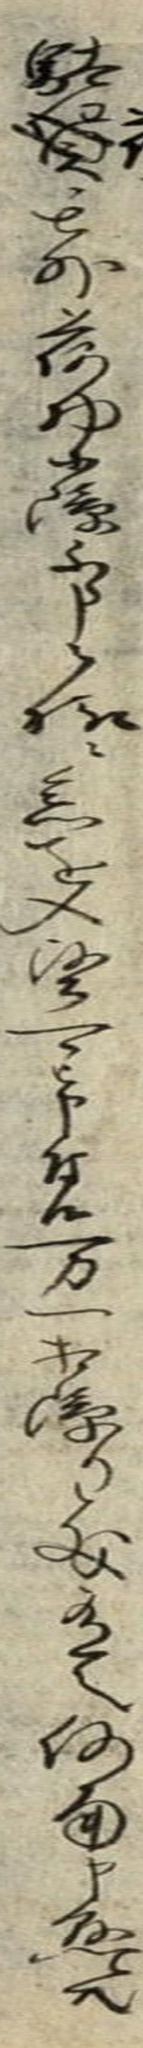駄賃荷其外荷物に障不申候様に念を入堅可被申付候万一相障り候義有之何角申懸候共
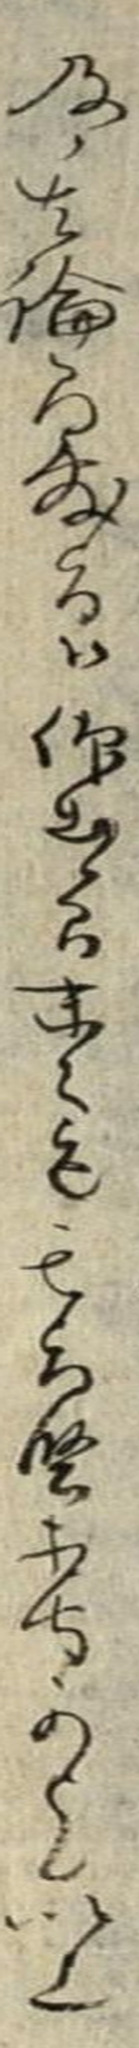及其論間敷旨被仰出候間末々迄其旨堅相守可申候以上
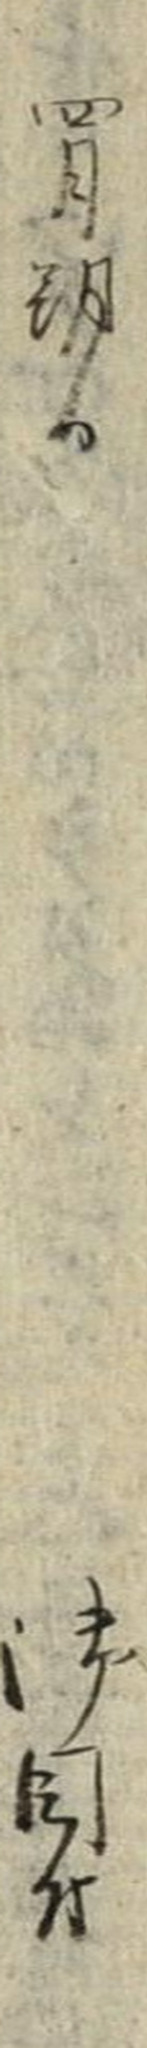四月朔日御目付
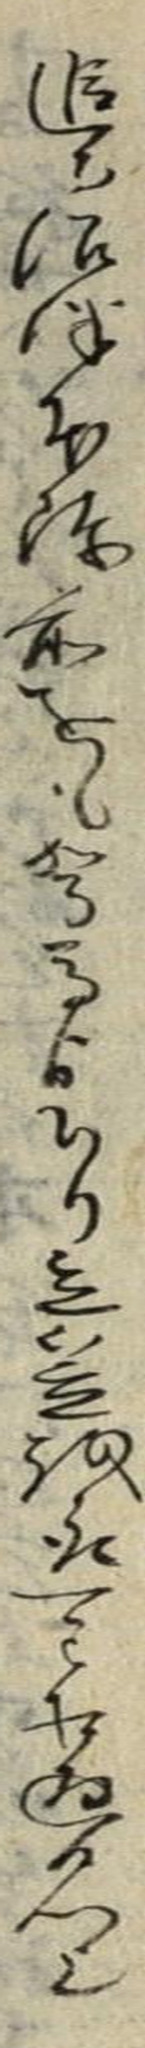追て沼津本陣前をも駕馬ゟ下り立笠を取可被相通候以上
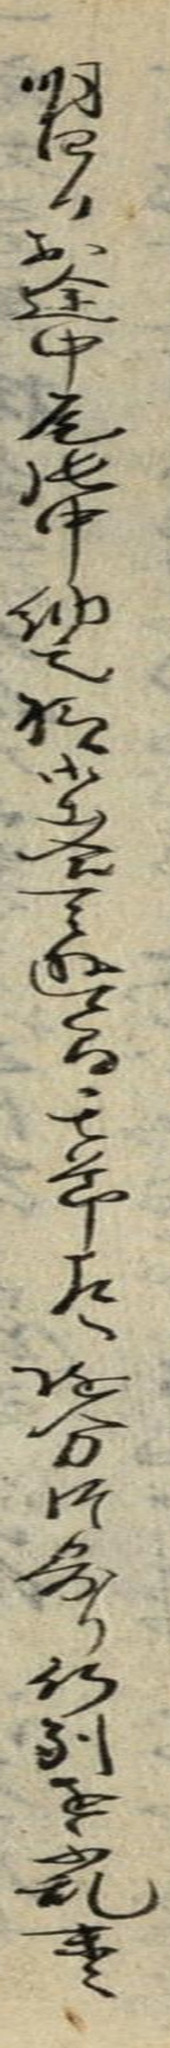一明四日於途中尾張中納言様へ御出合可被遊候間其節左へ随分片寄り行列を不乱末々
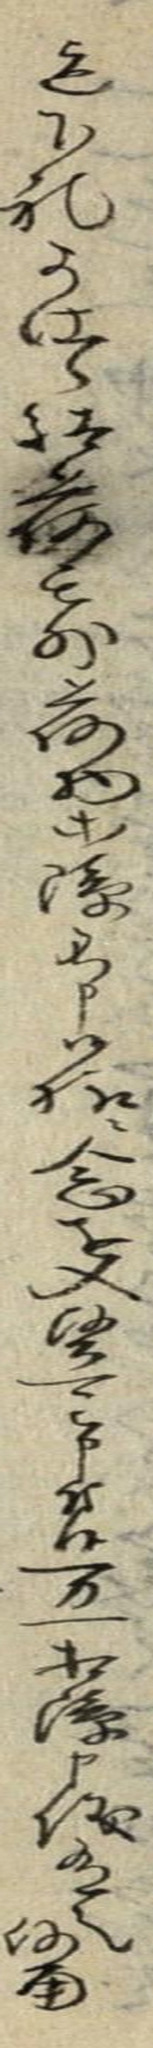迄下礼可仕候駄荷其外荷物等障不申候様に念を入堅く可被申付候万一相障申儀有之何角
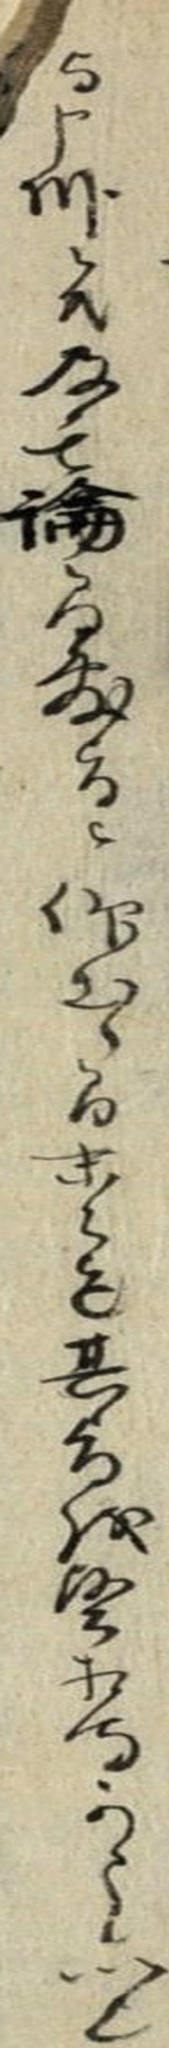と申掛候共及其論間敷旨被仰出候間末々迄其旨を堅相守可申候以上
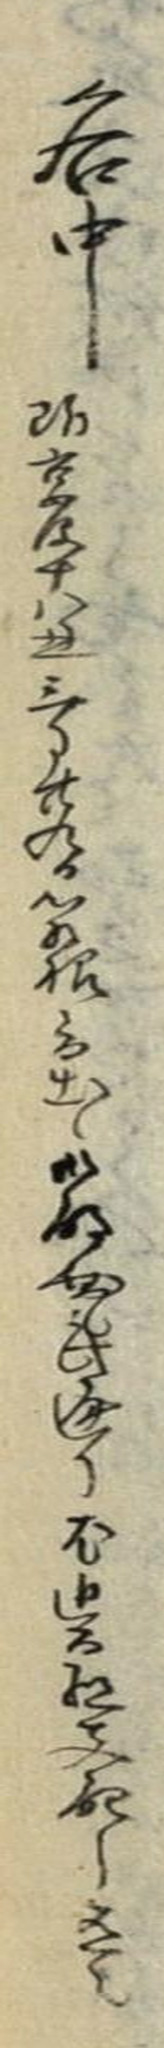各中附享保十八丑三月廿九日箱根にて出候御触書も此通り尤追而組支配へ有之
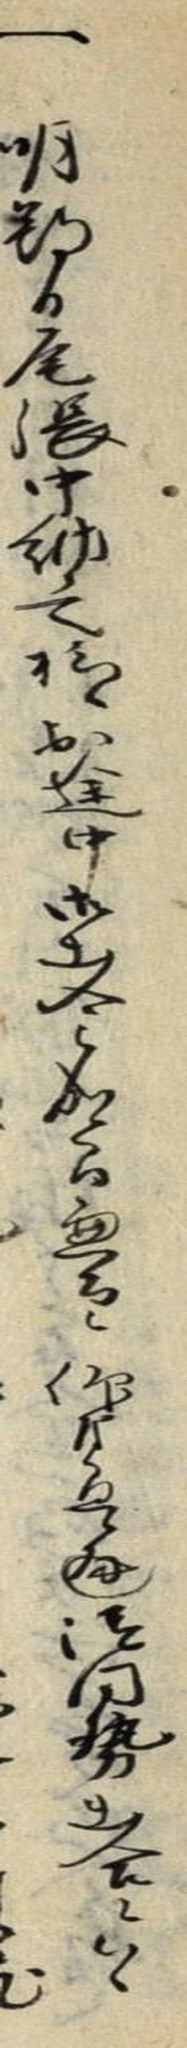一明朔日尾張中納言様へ於途中御出合被成候間兼て被仰付置候通御同勢出合候はゝ
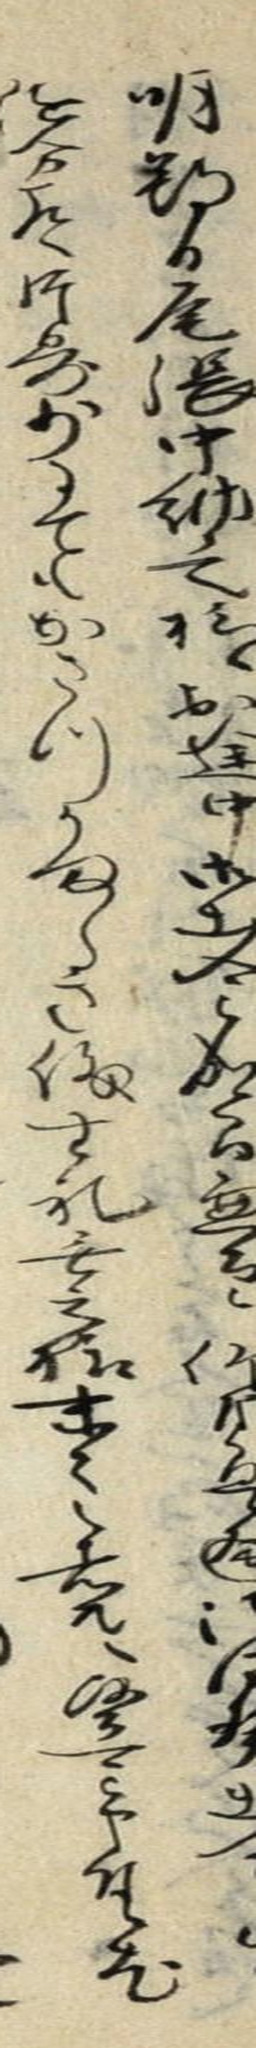随分左へ片寄少にてもかさつかましき儀無礼無之様末々之者共へ堅可被申付候尤
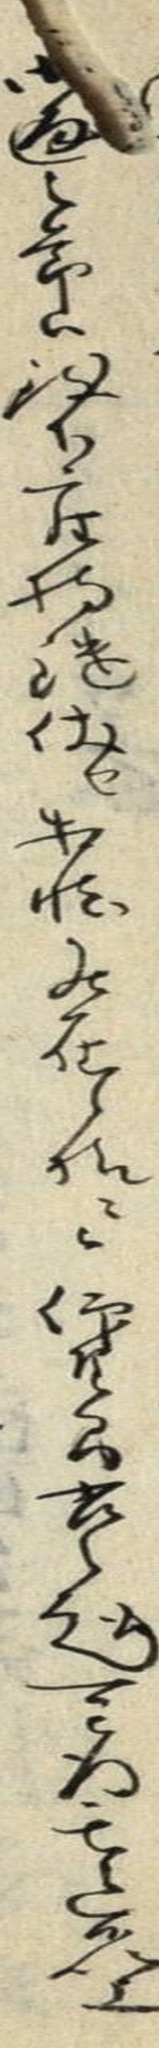御通之節は致下座持鑓伏せ相慎罷在候様に被仰付候間右之趣可被得其意候以上
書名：三都并道中之部
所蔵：福井県文書館 Fukui Prefectural Archives
